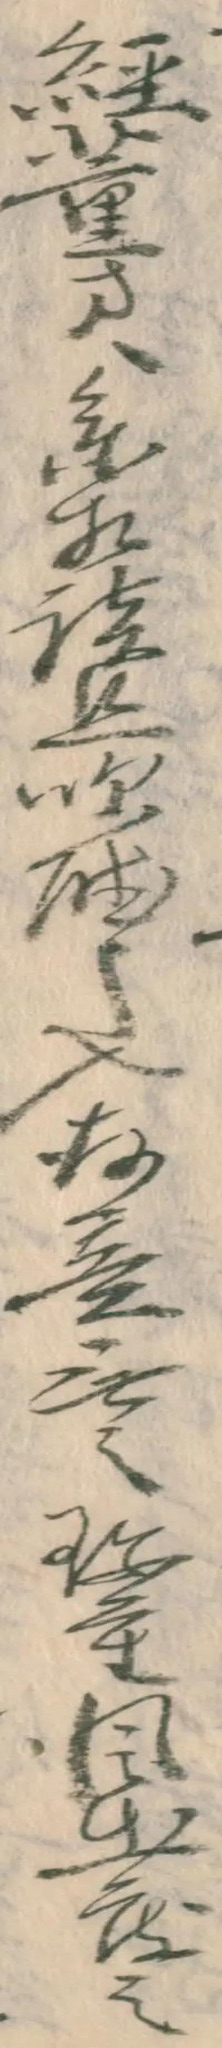経董方へ参相談且吹聴申入存意無之珍重目出度之
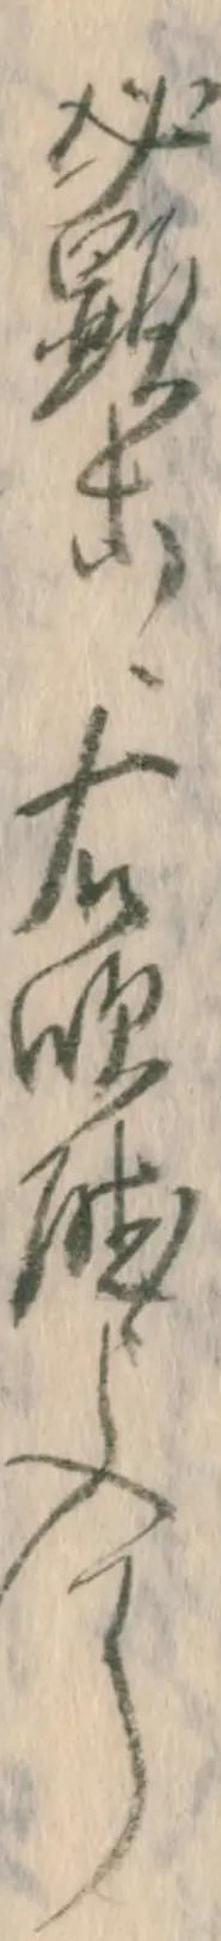必顕等右吹聴申入了
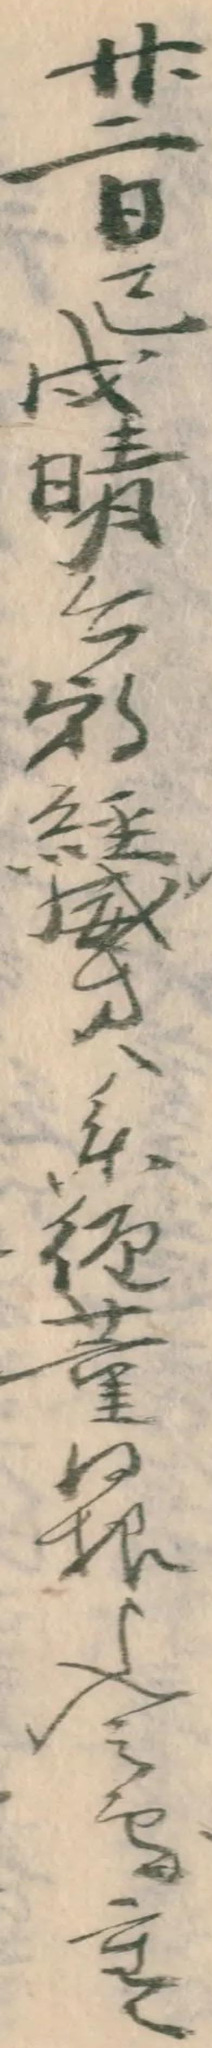廿二日己戌晴今朝経威方へ参経董同様申入之處重々
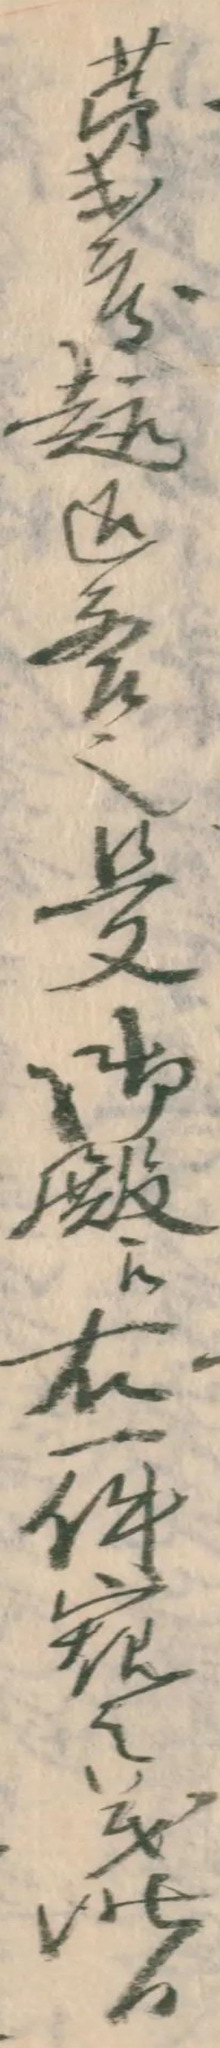出度趣返答也且又御殿え右一件宛之義昨日
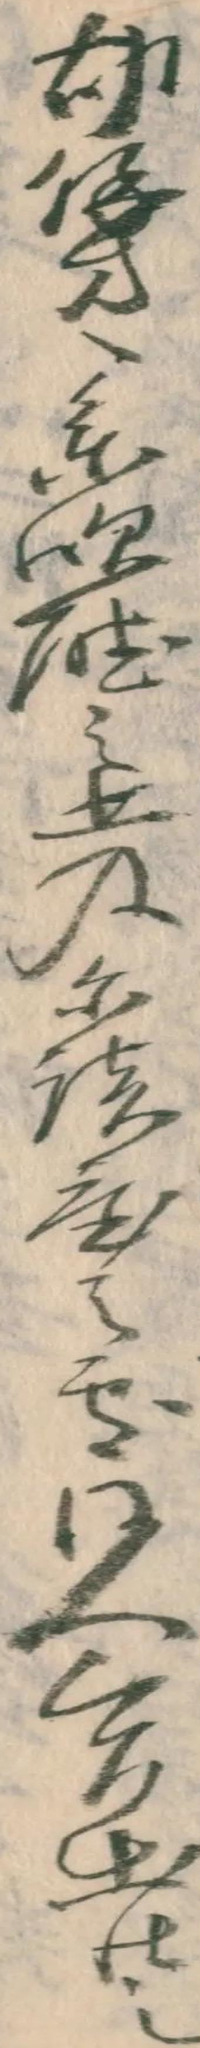胡保方へ参吹聴之上及に談置之處同人今日出仕之
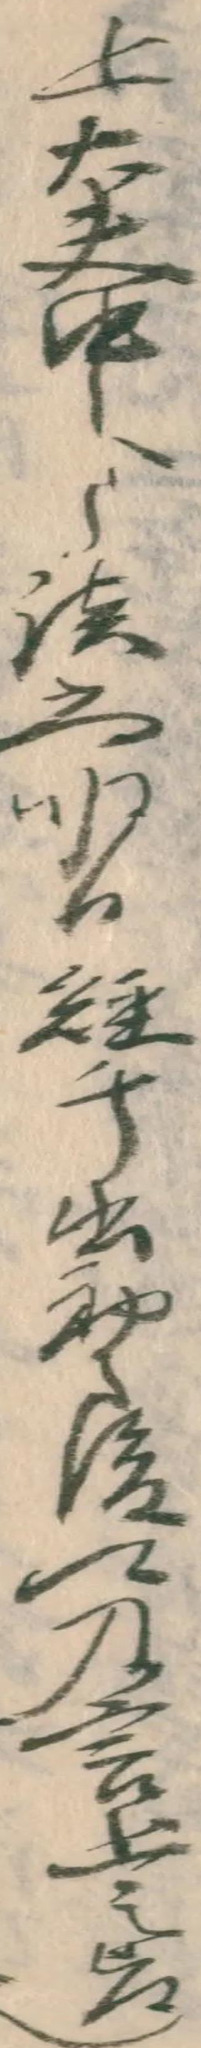上大夫中へ申談尚明日経千出勤之後可及言上之旨也
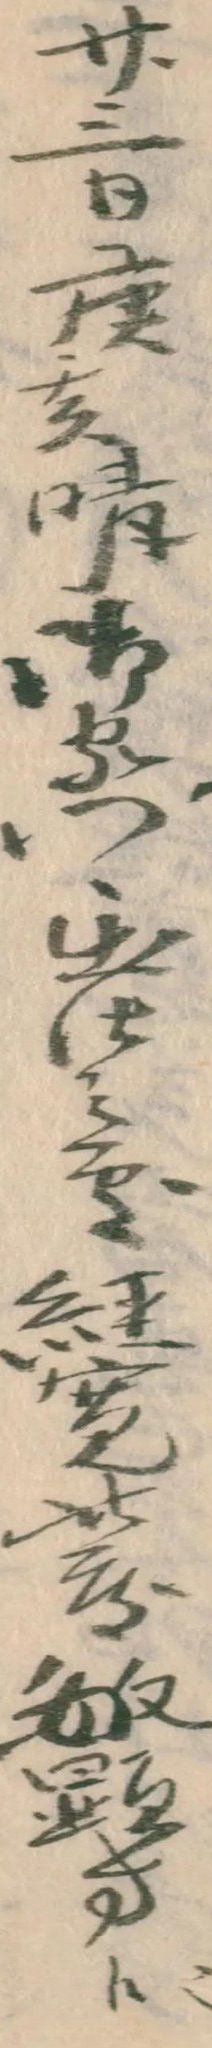廿三日庚亥晴御家門ヘ出仕之處経寛此度敏顕方え
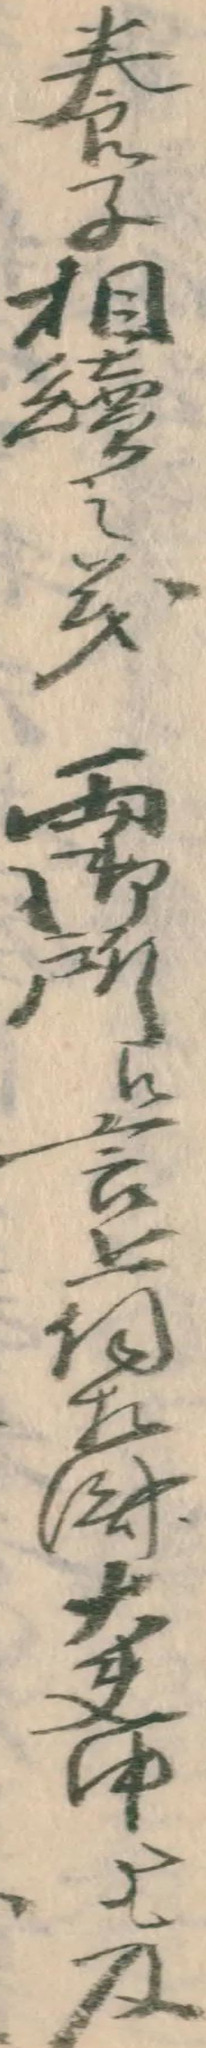養子相續之義両御所え言上伺相済大夫中へも及
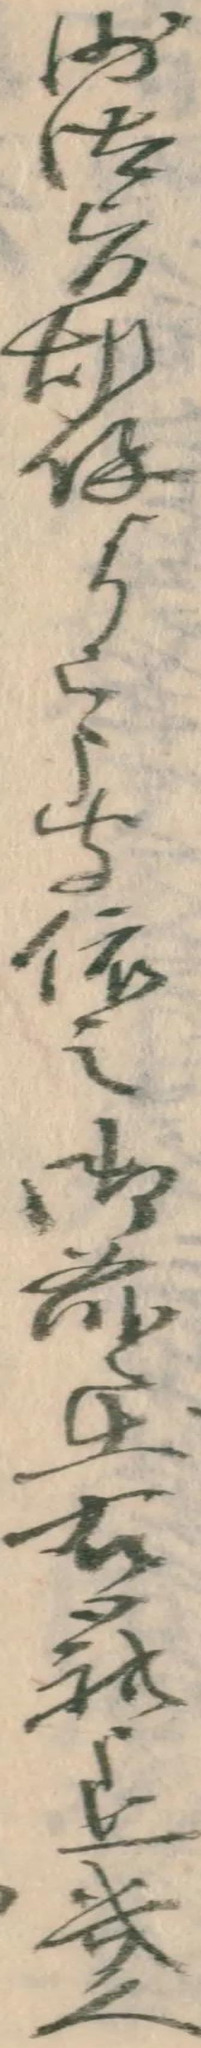沙汰旨胡保より被申聞依之御前へ出右御礼申上幾人
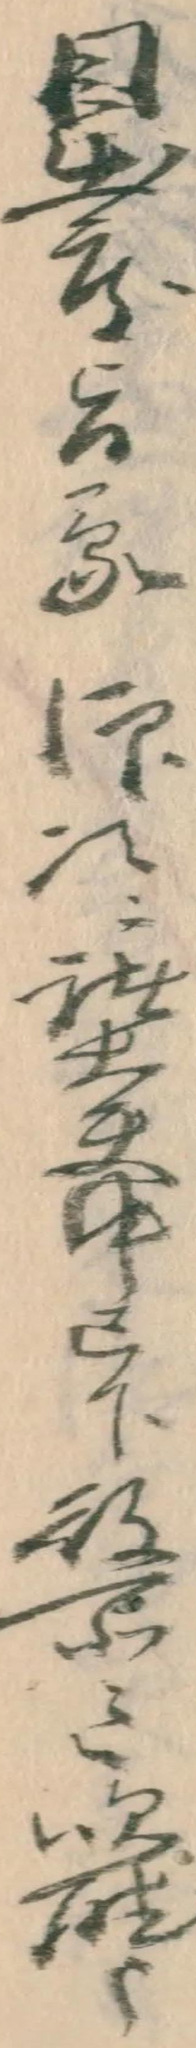目出度旨蒙仰次ニ諸大夫中已下役所々々吹聴申
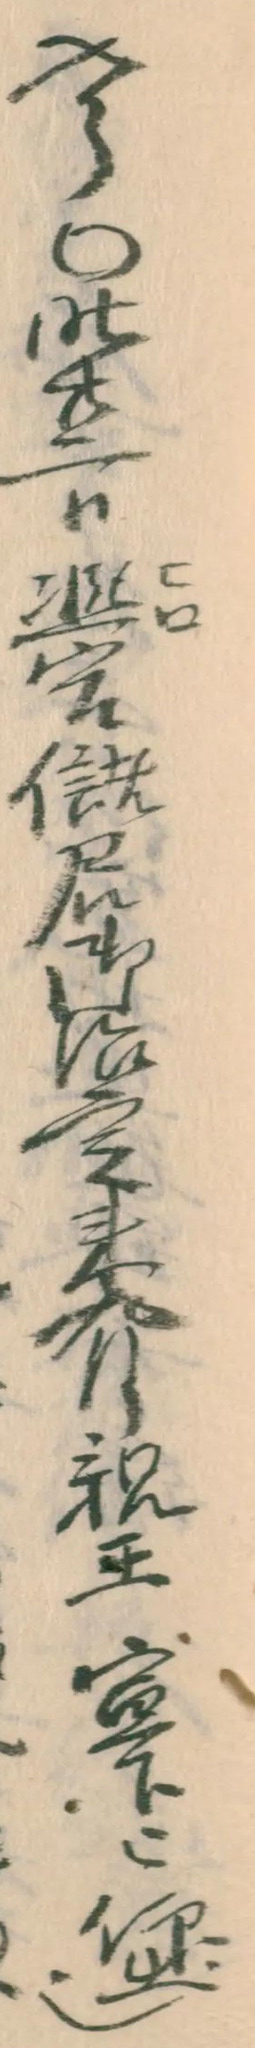入了〇昨廿二日煕宮儲君御治定来九月親王宣下被仰出也
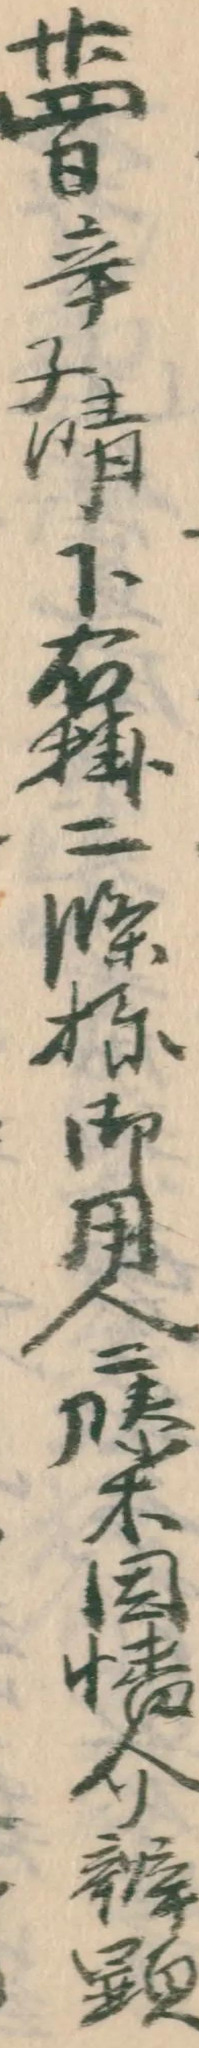廿四日辛亥晴下宿掛二條様御用人藤木因幡介辨顕
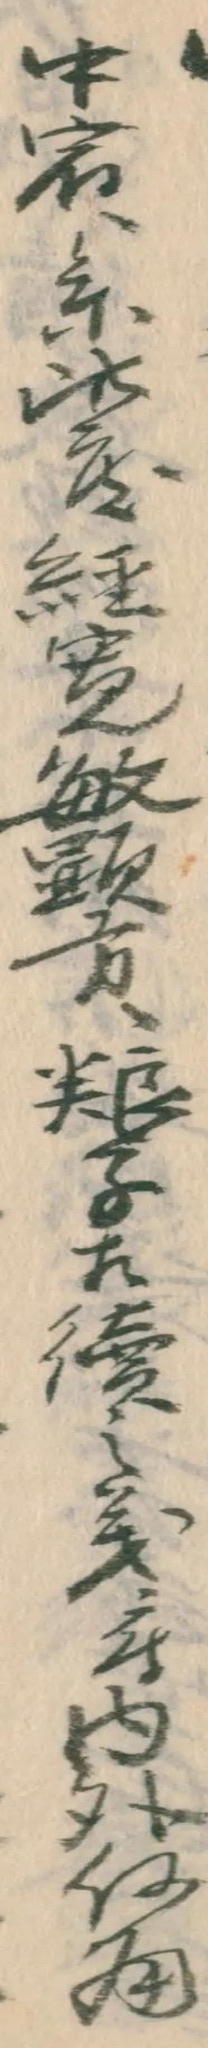中宿へ参此度経寛敏顕方へ養子相續之義ニ付内外何角
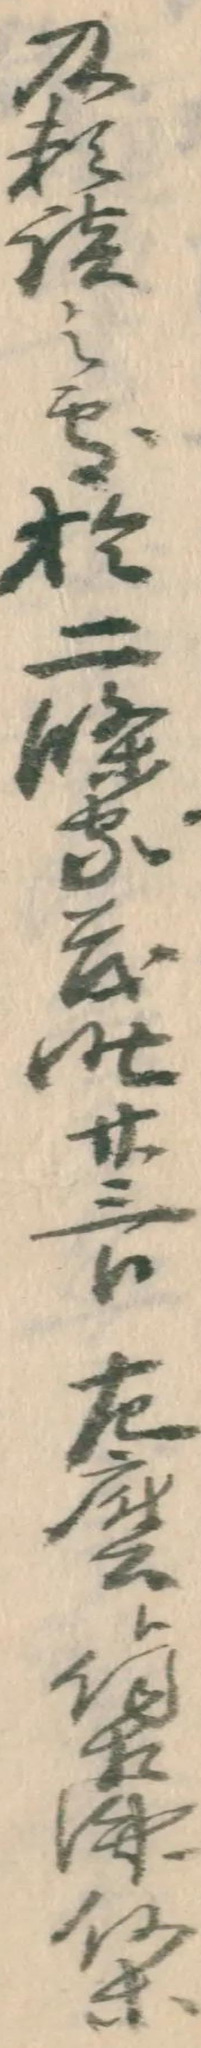及頼談之處於二條家茂昨廿三日左府公え伺相済何等
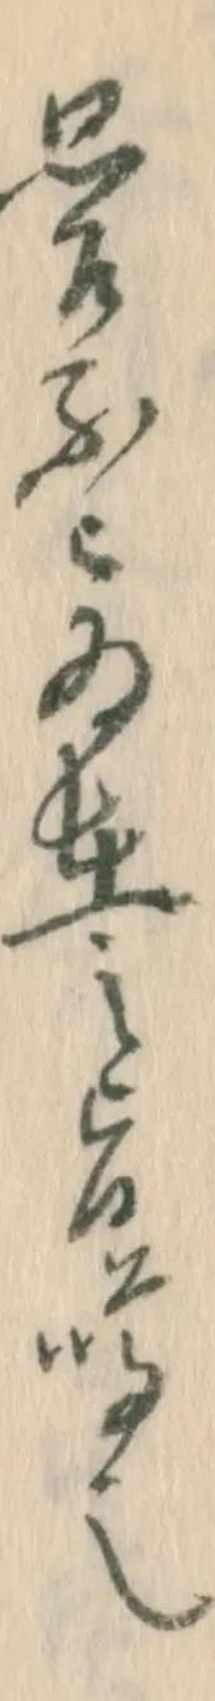思召不被為在之旨噂也
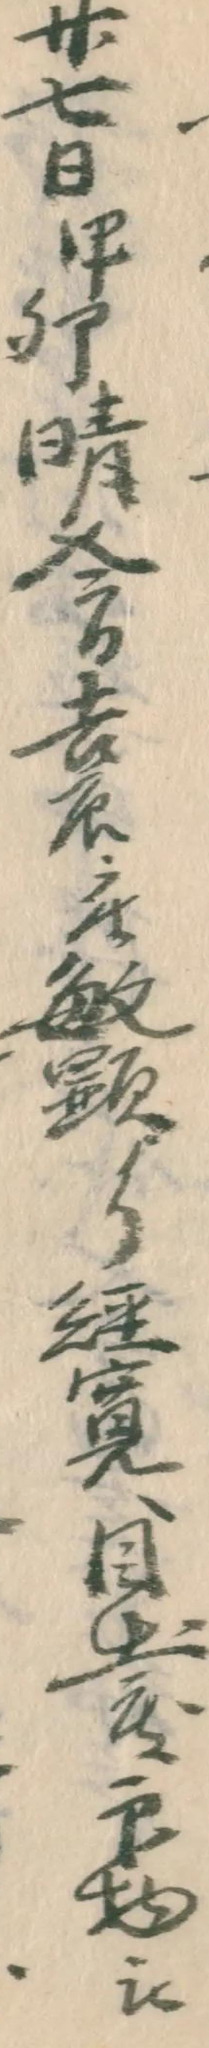廿七日甲卯晴今日吉辰ニ付敏顕より経寛へ目出度印物被
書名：賀茂社記録. 第67冊
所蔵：国立国会図書館 National Diet Library, JAPAN
